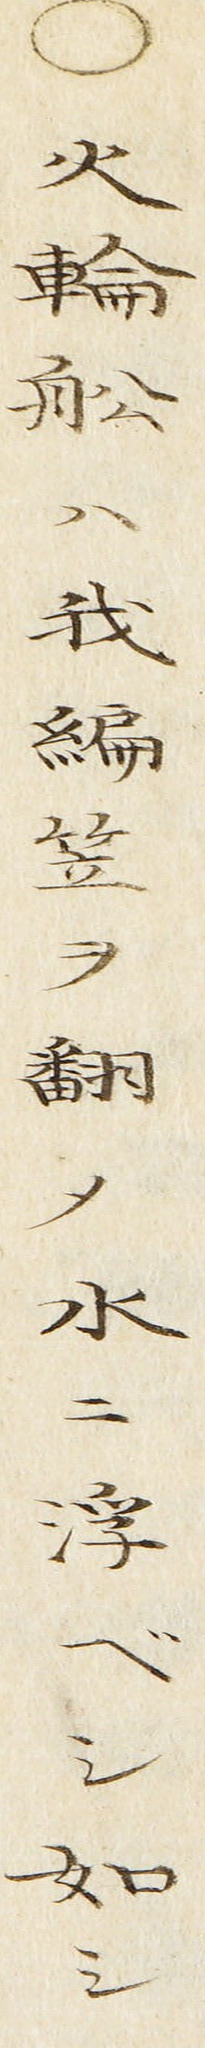○火輪舩ハ我編笠ヲ翻シテ水ニ浮ベシ如シ
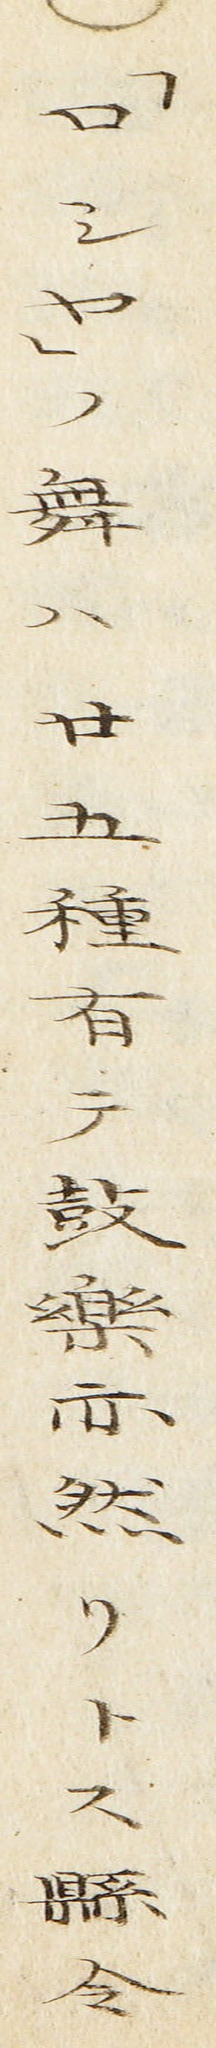○「ロシヤ」ノ舞ハ廿五種有テ鼓楽亦然リトス縣令
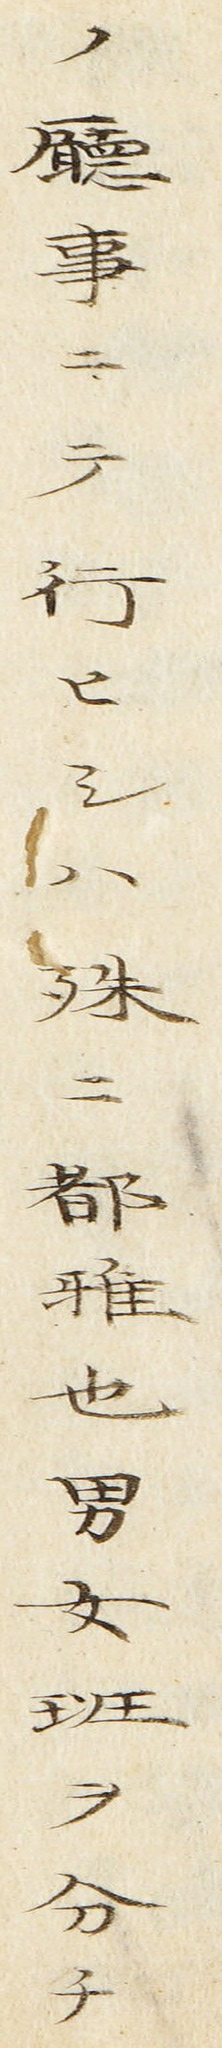ノ廳事ニテ行ヒシハ殊ニ都雅也男女班ヲ分チ
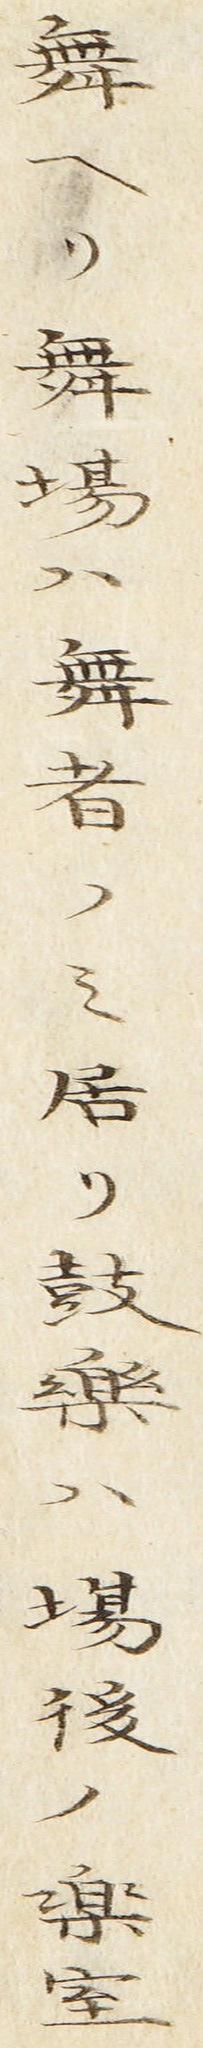舞ヘリ舞場ハ舞者ノミ居リ鼓楽ハ場後ノ楽室
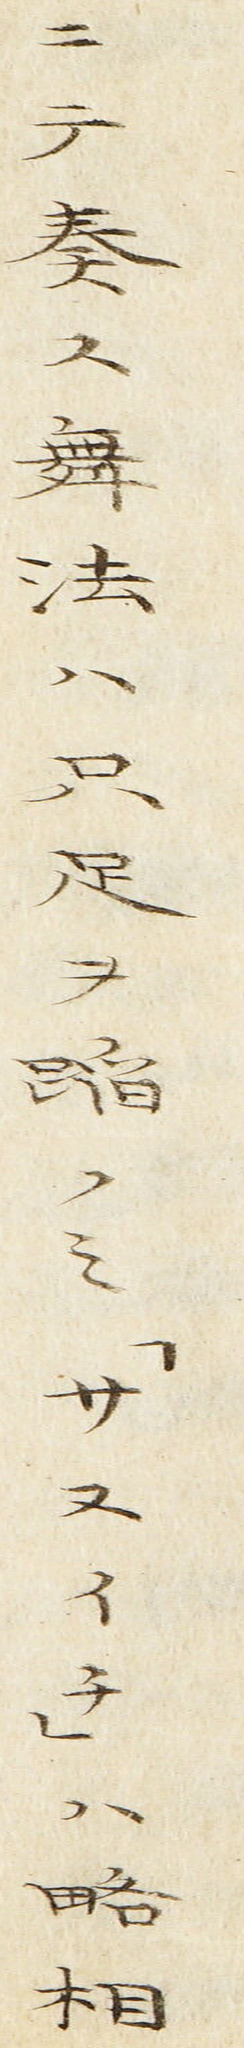ニテ奏ス舞法ハ只足ヲ踏ノミ「サヌイチ」ハ略相
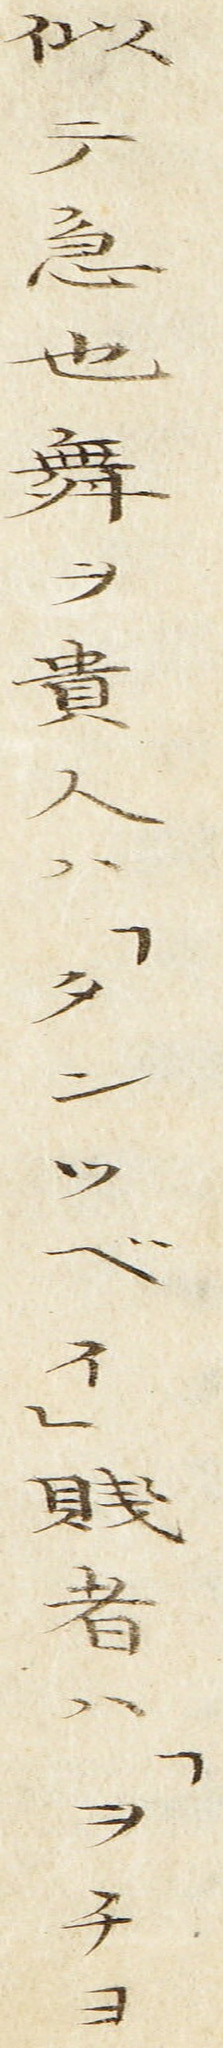似テ急也舞ヲ貴人ハ「タンツベイ」賤者ハ「ヲチヨ
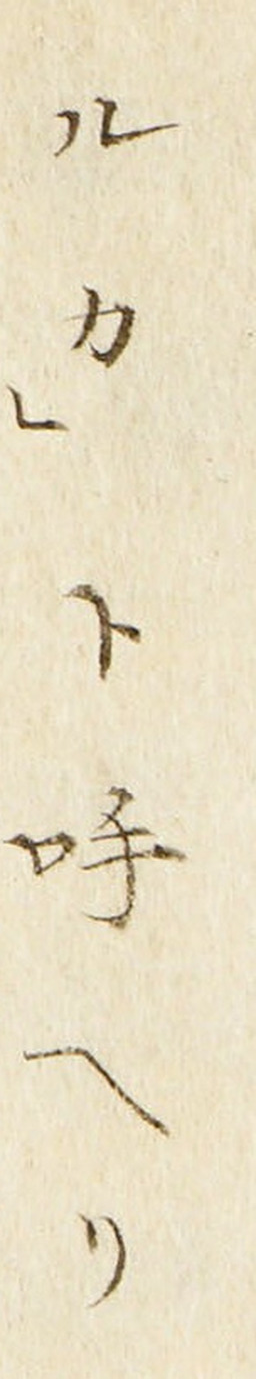ルカ」ト呼ヘリ

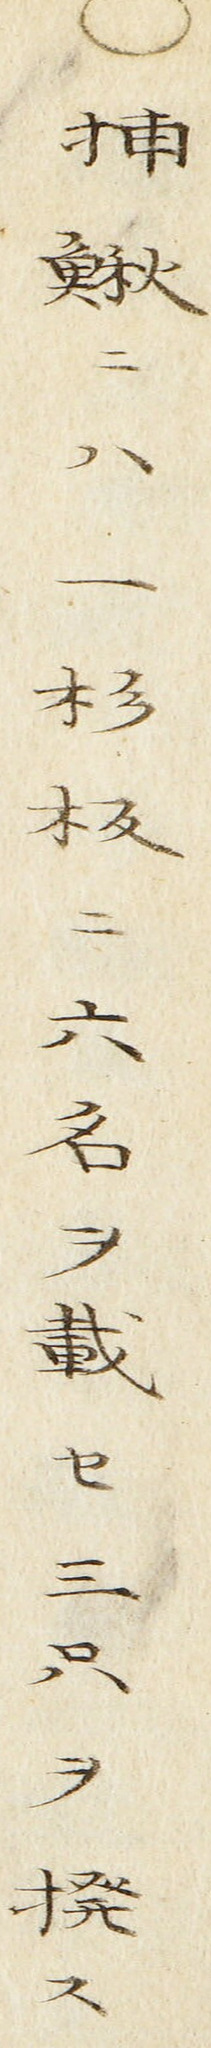○捕鰍ニハ一杉板ニ六名ヲ載セ三只ヲ撥ス
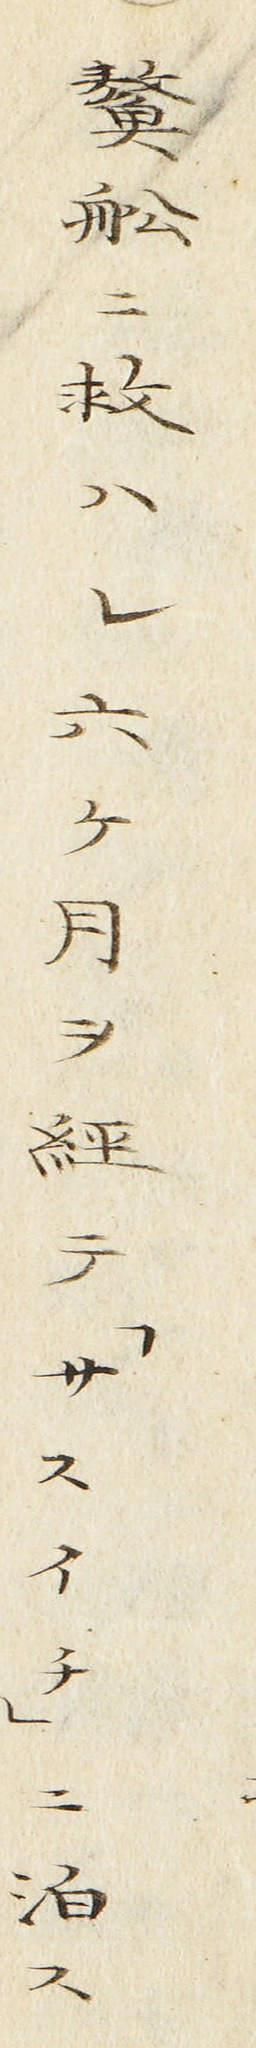○鰲舩ニ救ハレ六ケ月ヲ経テ「サスイチ」ニ泊ス
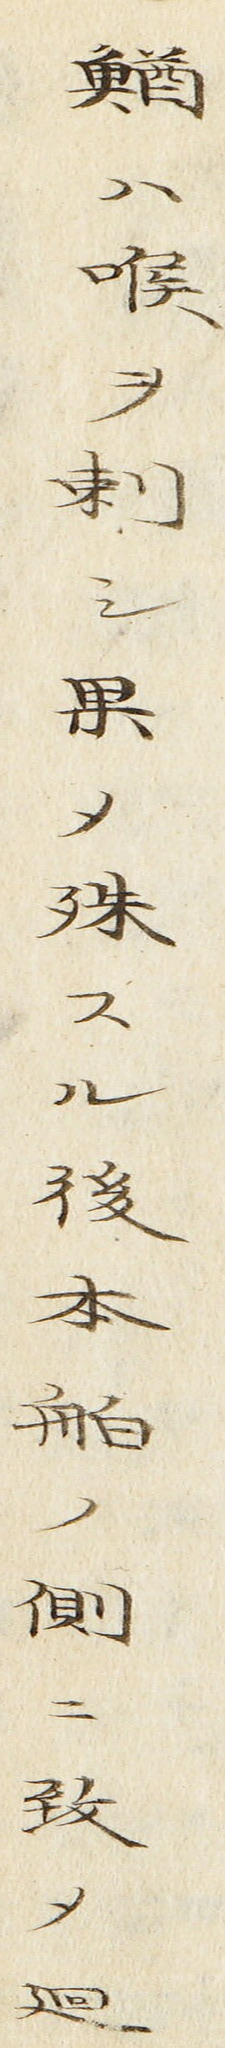鰌ハ喉ヲ刺シ果シテ珠スル後本舶ノ側ニ致シテ廻
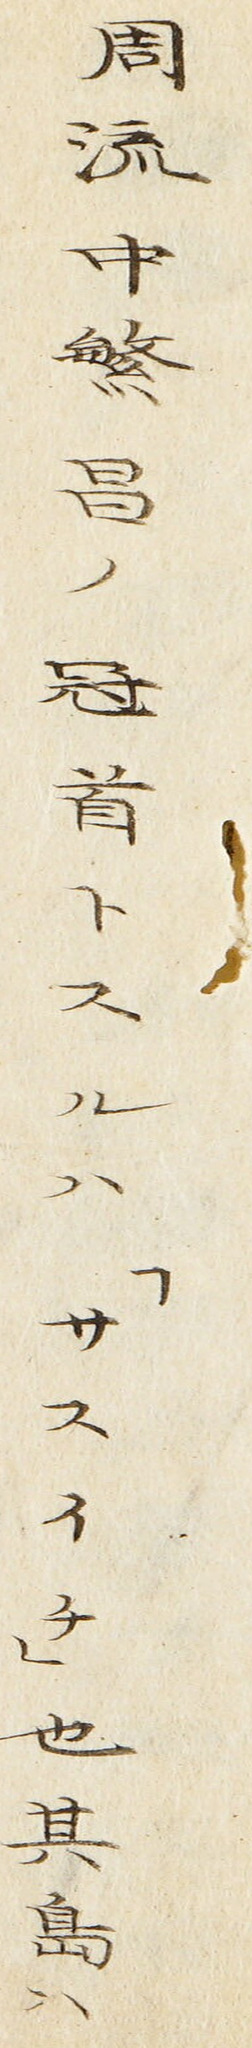〇周流中繁昌ノ冠首トスルハ「サスイチ」也其島ハ
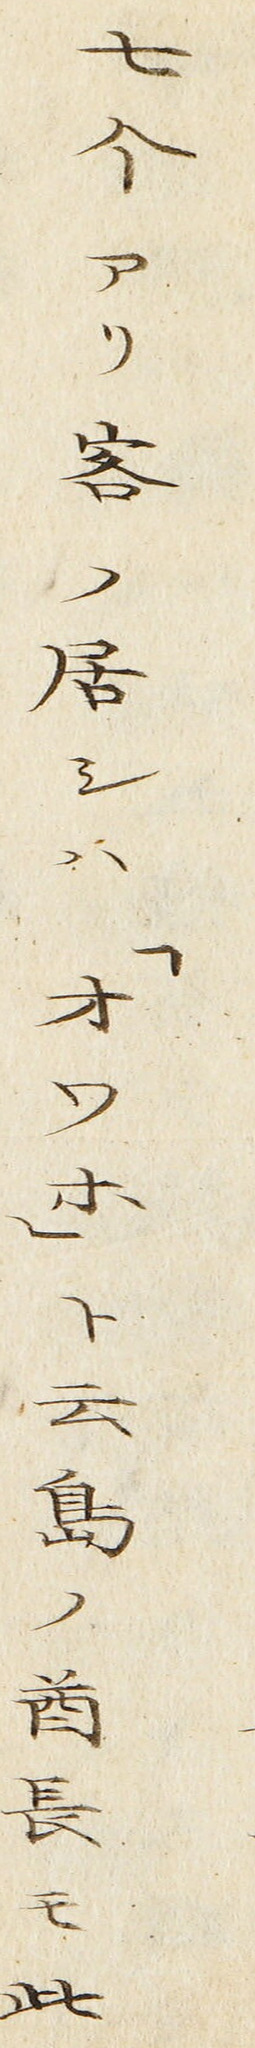七个アリ客ノ居シハ「オワホ」ト云島ノ酋長モ此
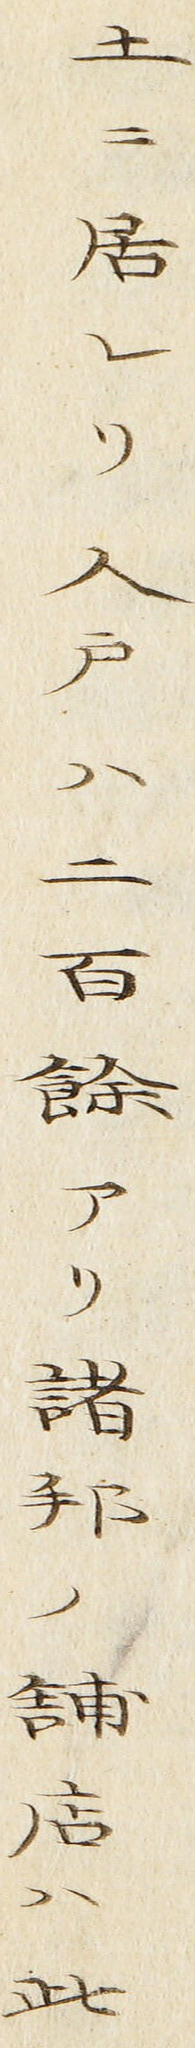土ニ居レリ人戸ハ二百餘アリ諸邦ノ舗店ハ此
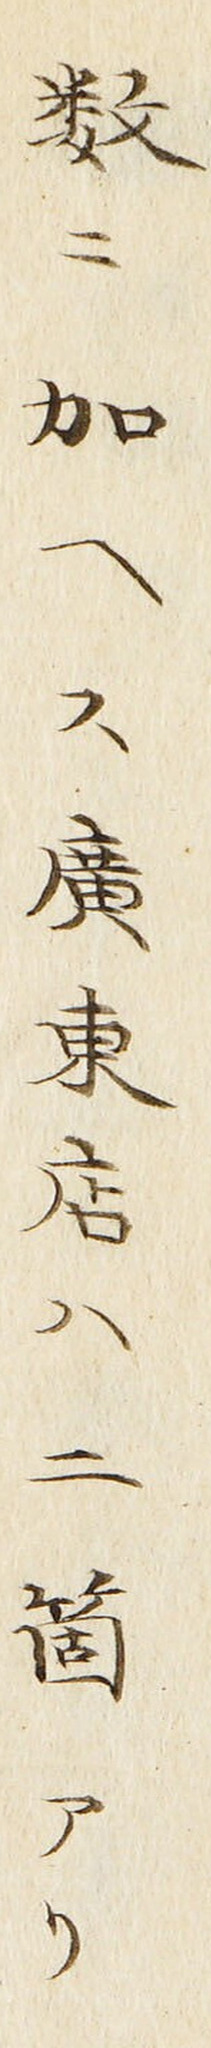数ニ加ヘス廣東店ハ二箇アリ
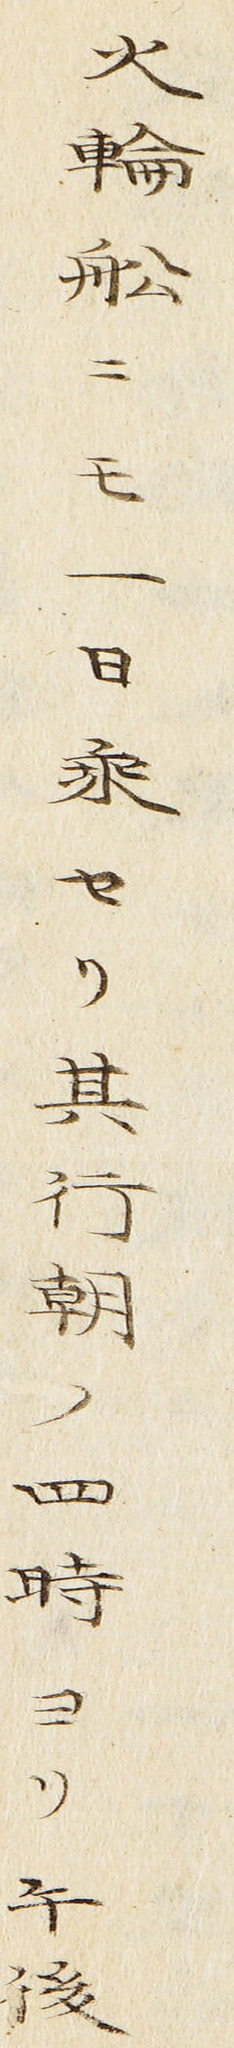〇火輪舩ニモ一日乗セリ其行朝ノ四時ヨリ午後
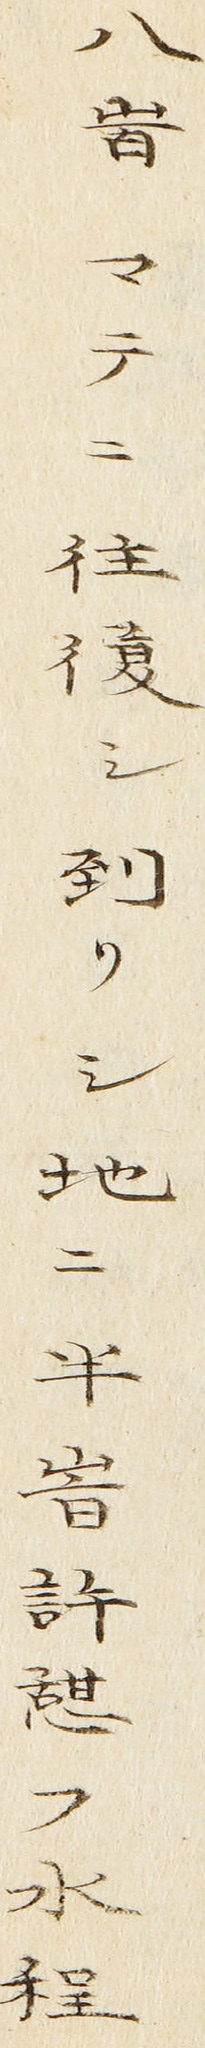八旹マテニ住復シ到リシ地ニ半旹許憩フ水程
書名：蕃談
